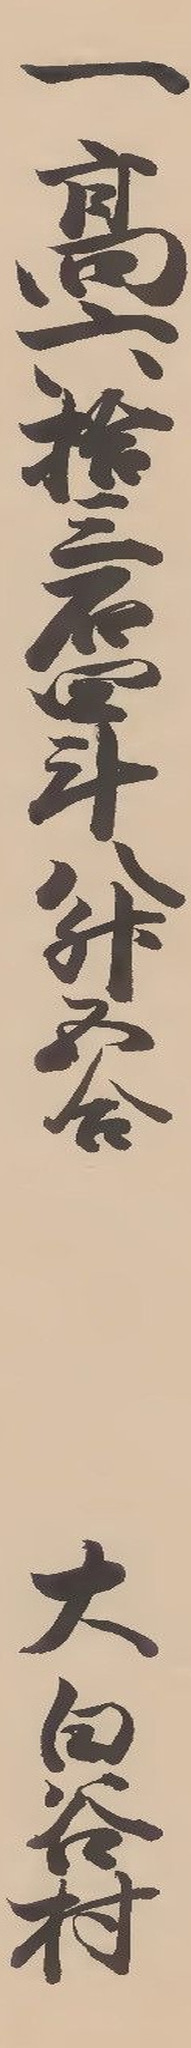一高六拾三石四斗八升五合大白谷村
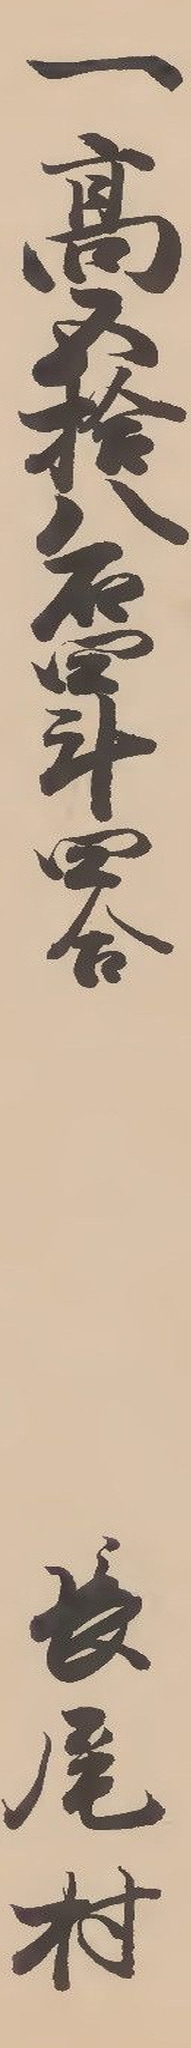一高五拾八石四斗四合長尾村
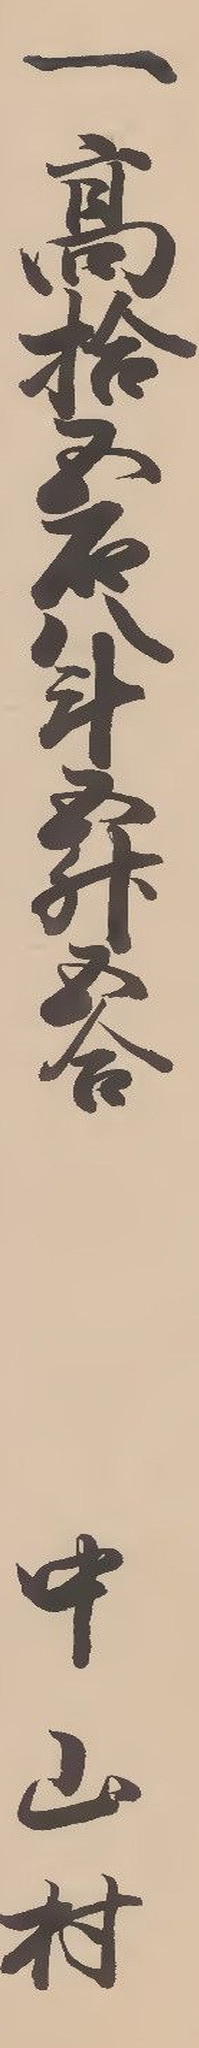一高拾五石八斗五升五合中山村
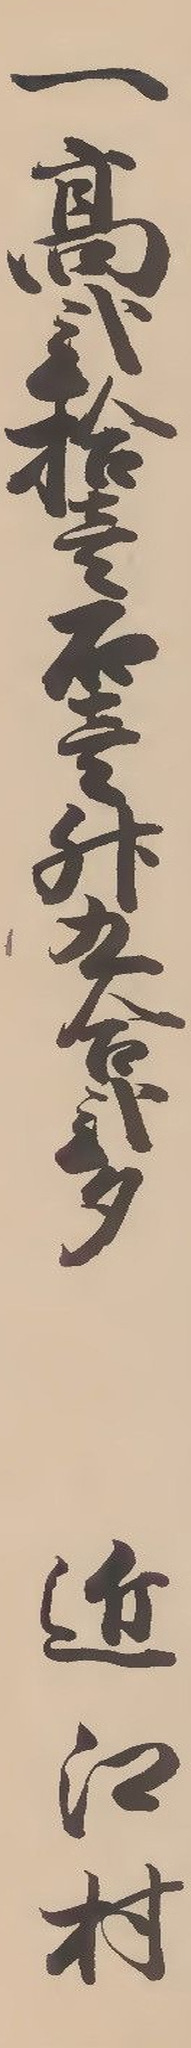一高弐拾壱石壱升九合弐勺近江村
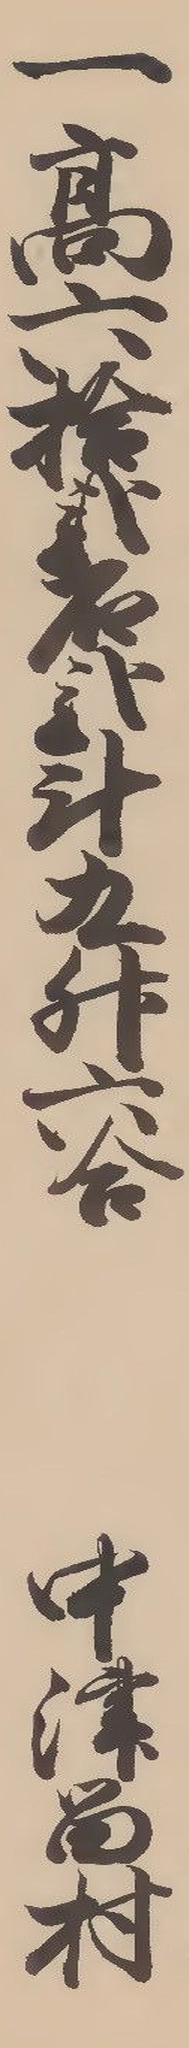一高六拾弐石弐斗九升六合中津留村
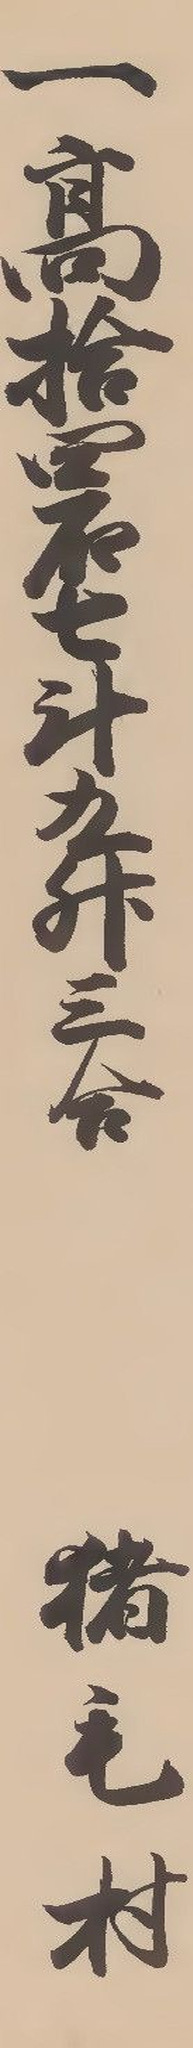一高拾四石七斗九升三合猪毛村
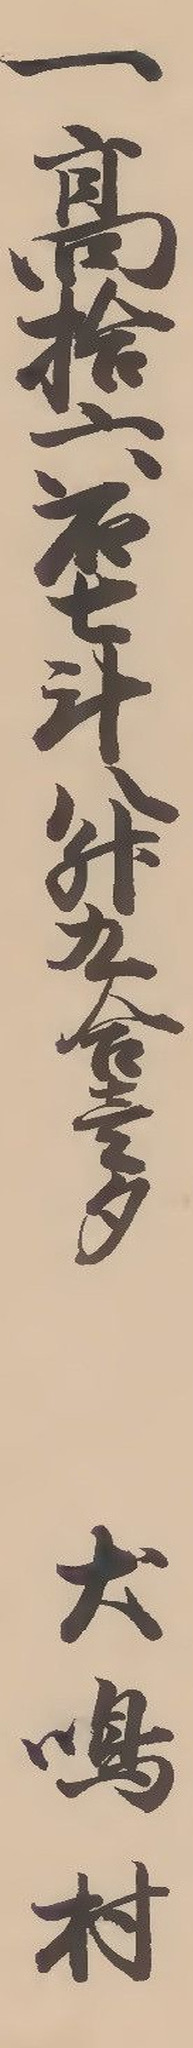一高拾六石七斗八升九合壱勺犬鳴村

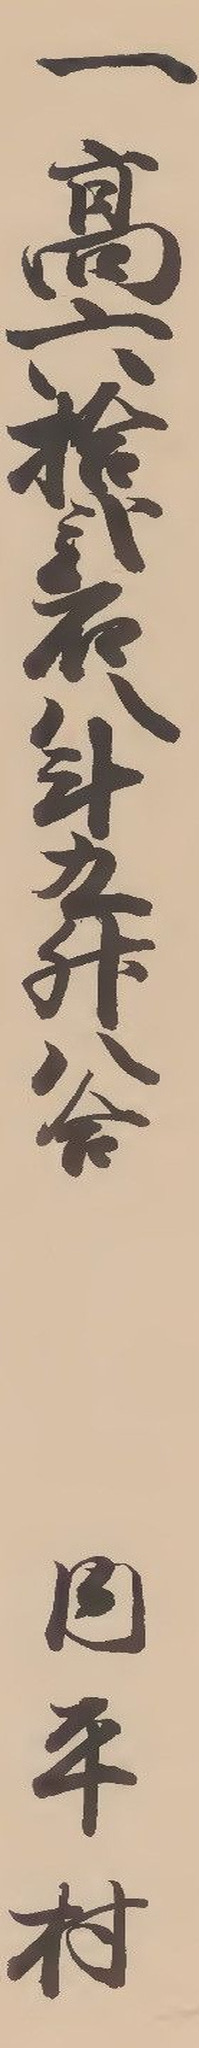一高六拾弐石八斗九升八合内平村
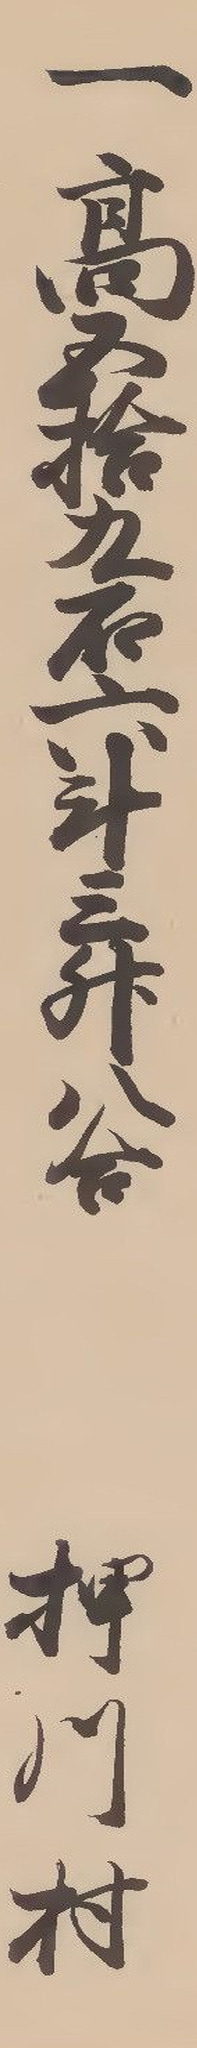一高五拾九石六斗三升八合押川村
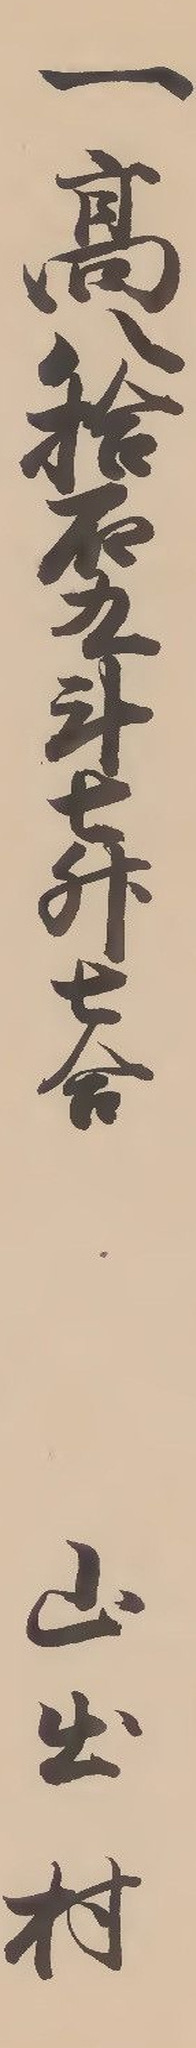一高八拾石九斗七升七合山出村
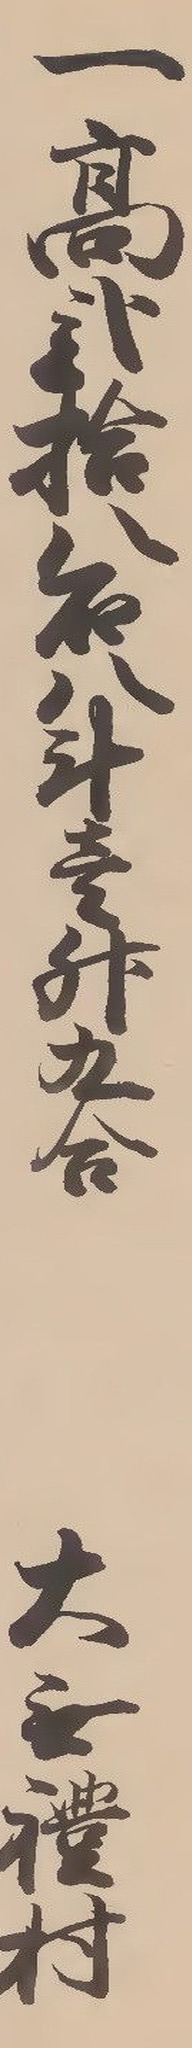一高弐拾八石八斗壱升九合大無礼村
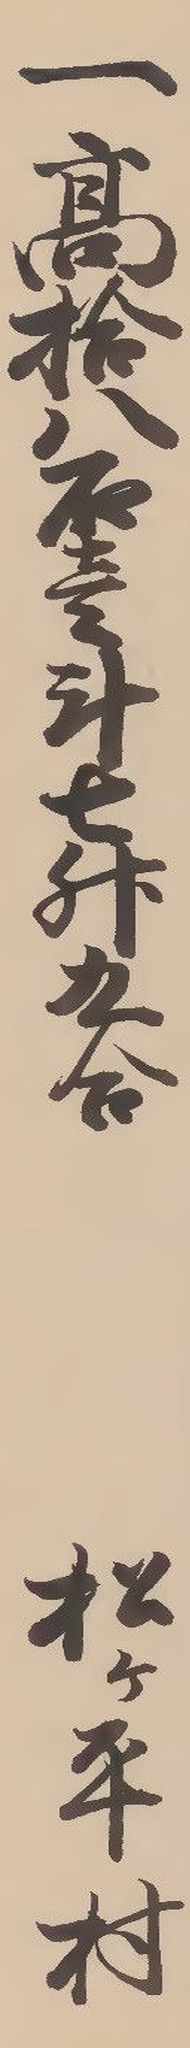一高拾八石壱斗七升九合松ヶ平村
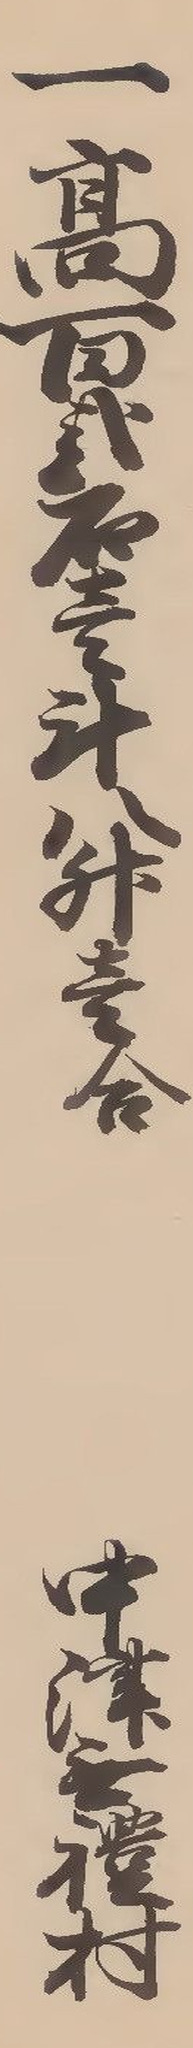一高百弐石壱斗八升壱合中津無礼村
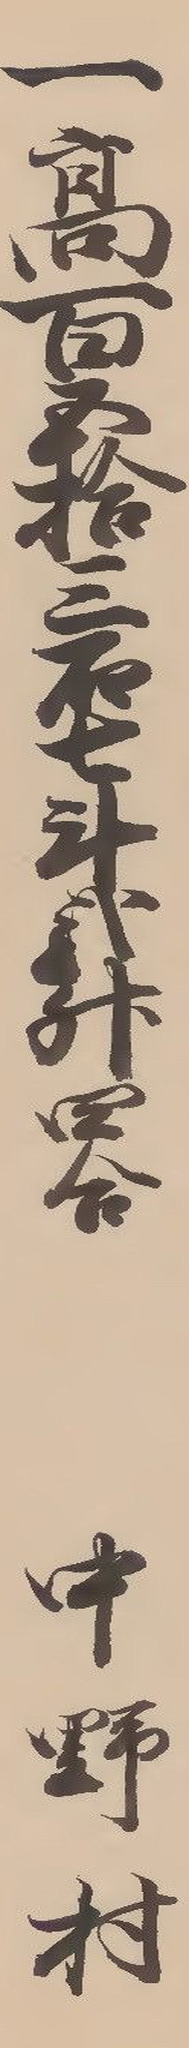一高百五拾三石七斗弐升四合中野村
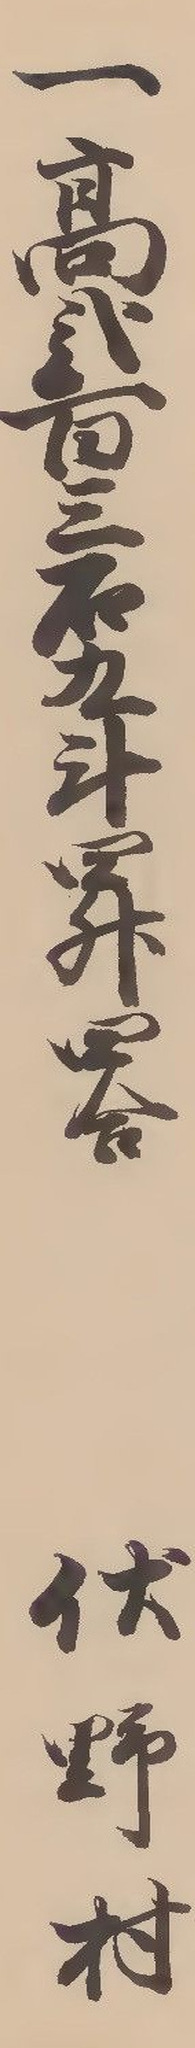一高弐百三石九斗四升四合伏野村

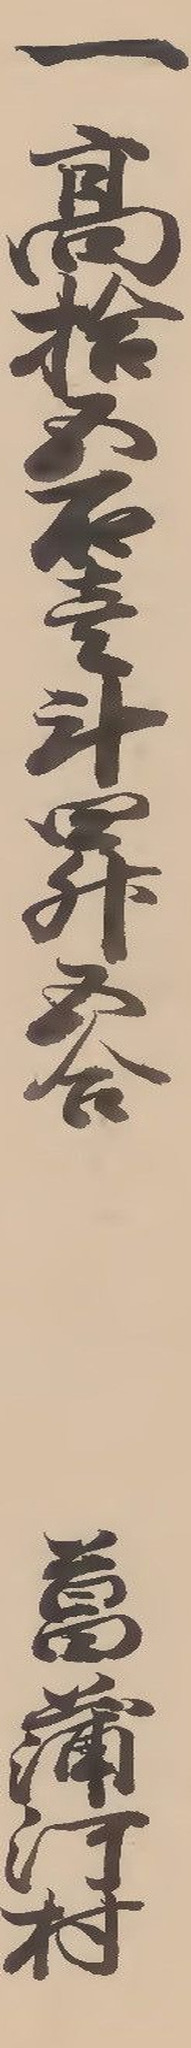一高拾五石壱斗四升五合菖蒲河村
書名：豊後国郷帳
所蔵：国立公文書館 National Archives of Japan
